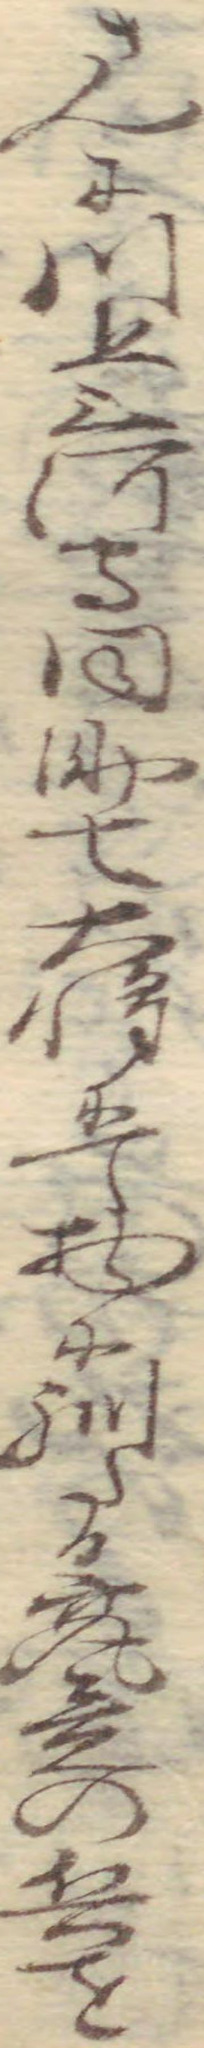さんに川上三河守同助七大将にて物に馴たる究竟の兵を
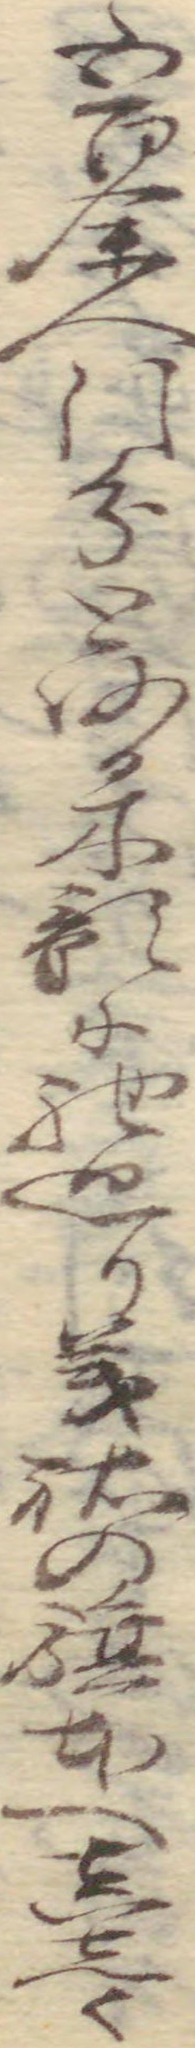五百余人引分とある木影に馳廻り義祐の旗本へ真しく
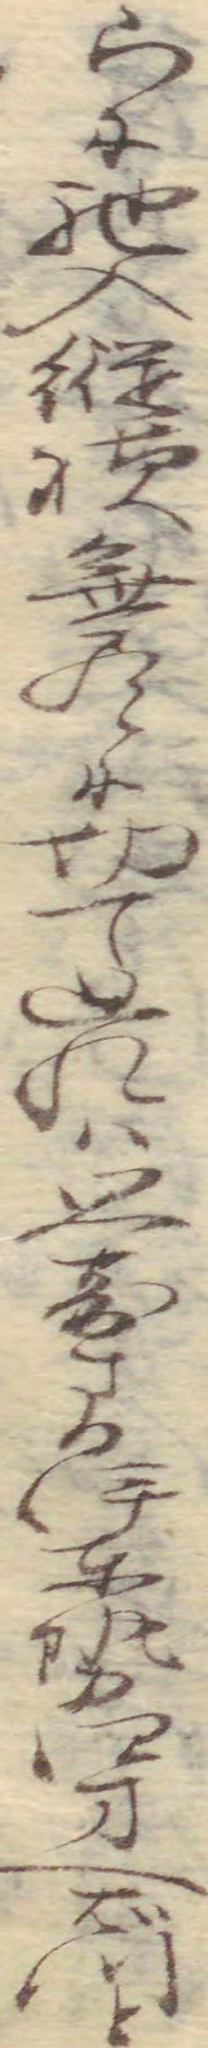らに馳入縦横無尽に切て廻れは思寄さる伊東勢四方へばつと
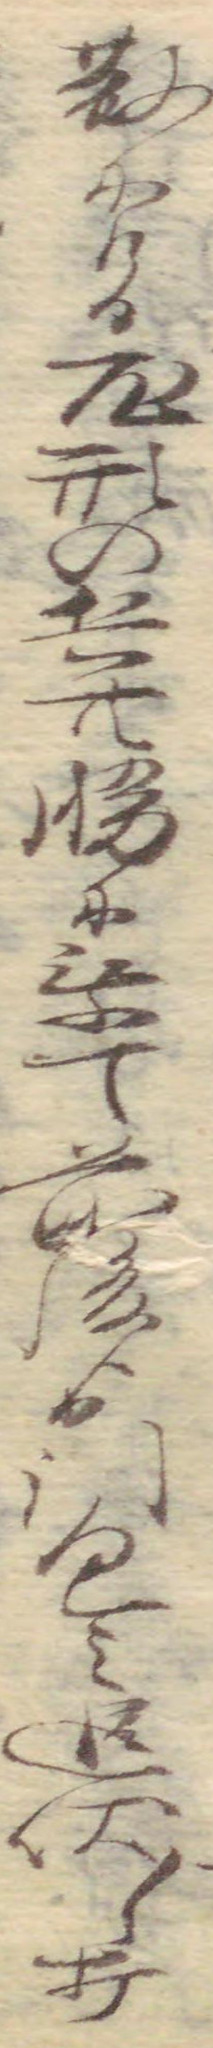散にける屋形の兵共勝に乗て前後ゟ引包み追伏〳〵打
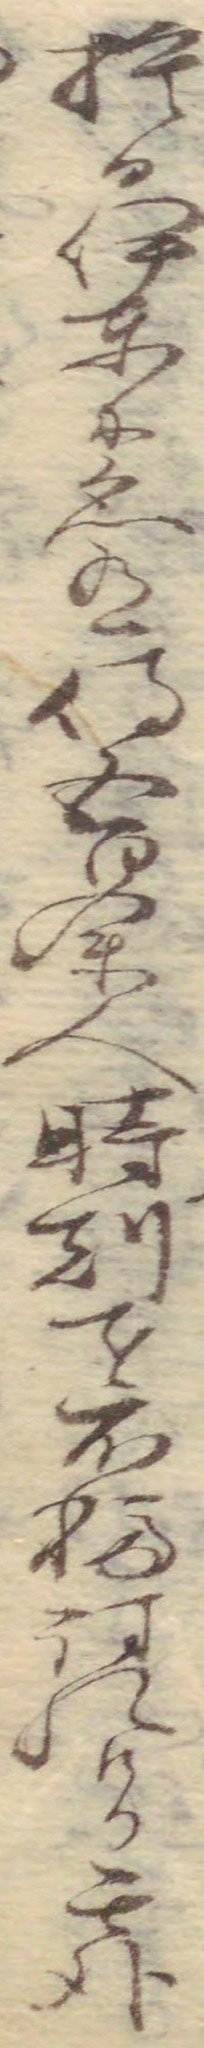捨る伊東に名有侍五百余人時刻を不移討れけり其外
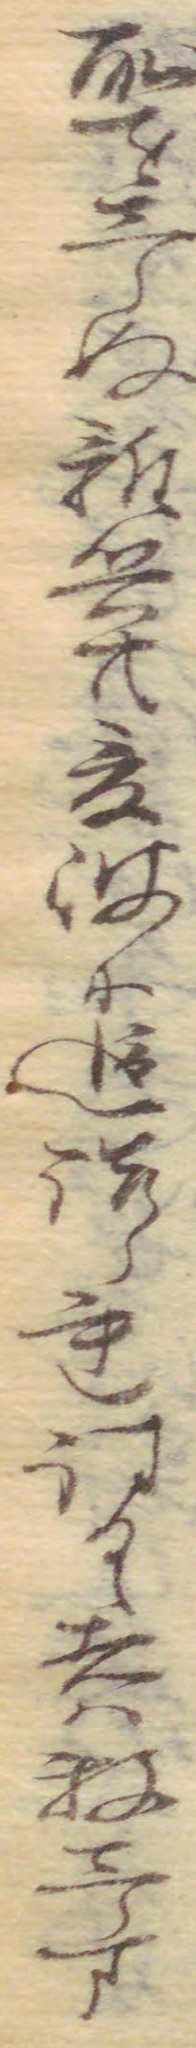恥をしらぬ雑兵共爰彼に追詰られ討るゝ者は数しらす

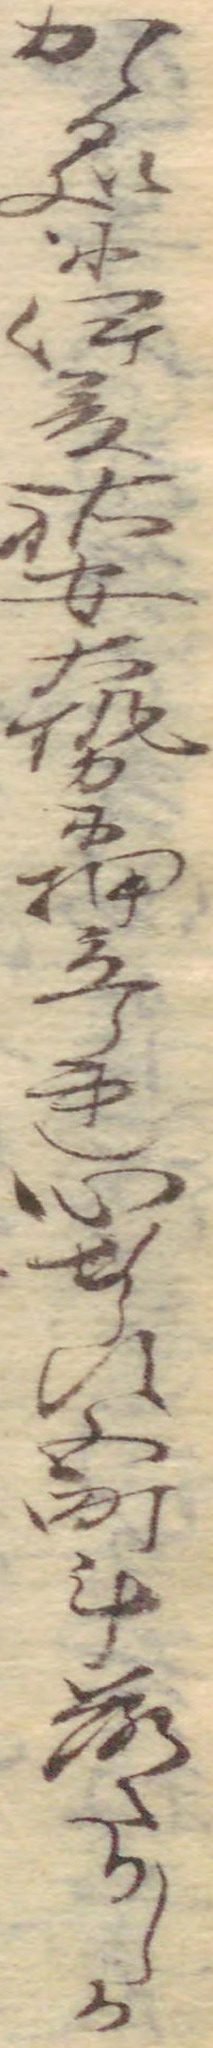かゝる処に伊藤祐安大勢に押立られ心ならす五町斗落たりしか
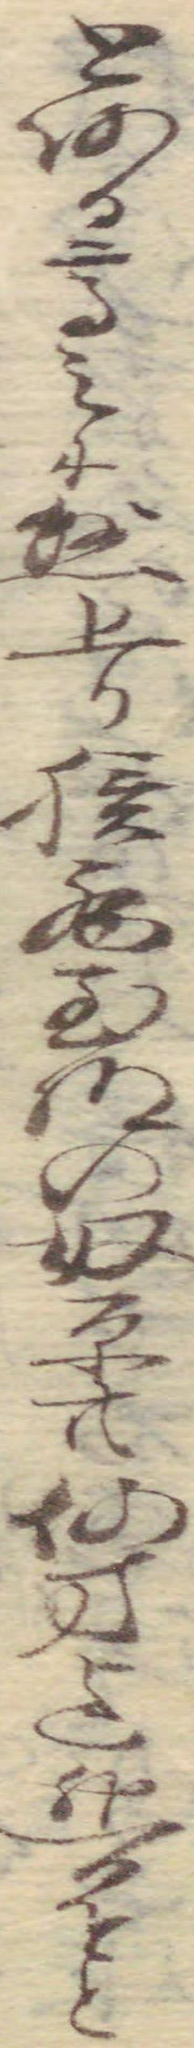とある高みに懸上り臆病至極の奴原共何方迄逃るそと
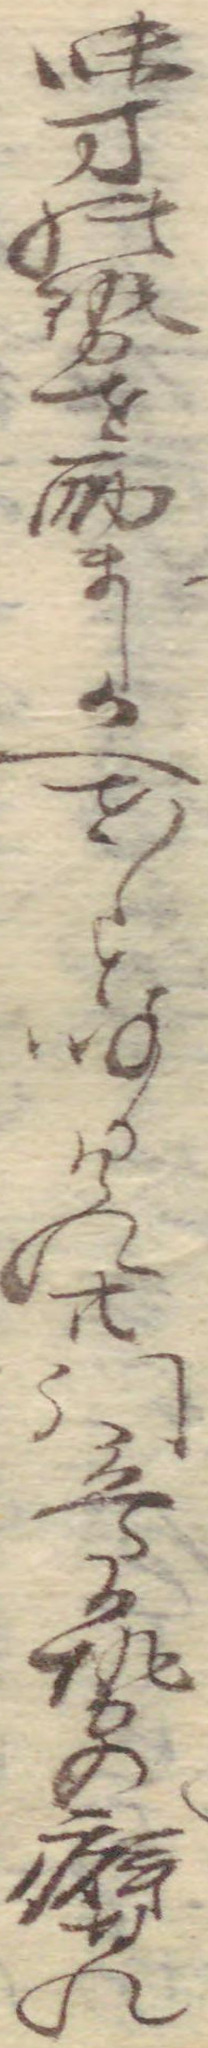味方の勢を励ましかへせ〳〵と呼りけれ共引立たる勢の癖なれ
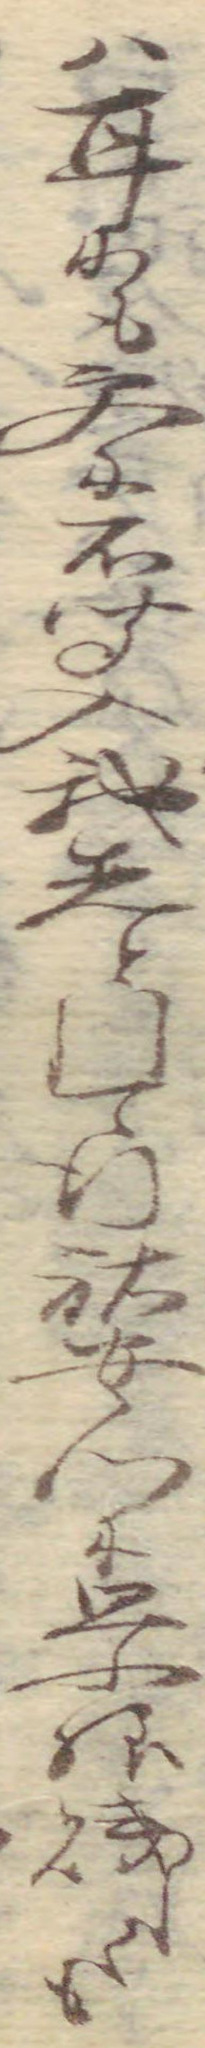は耳にも更に不聞入我先と引て行祐安心に思ふ様賤しくも
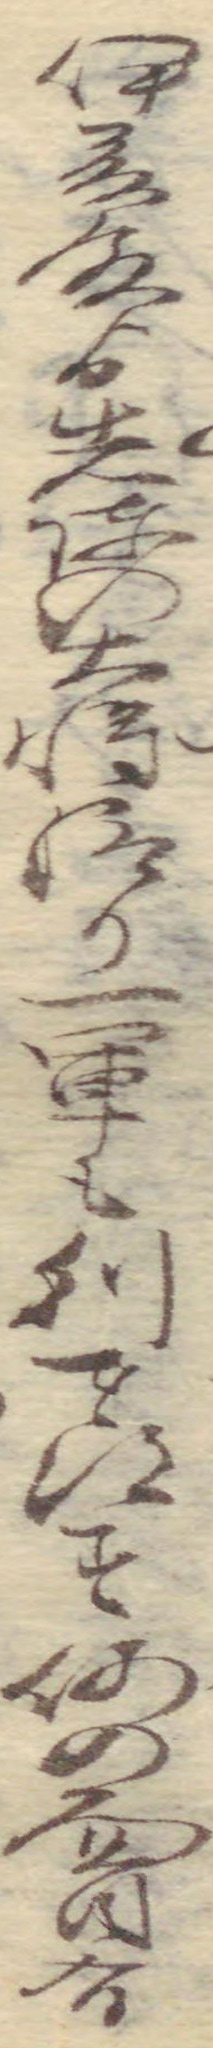伊藤殿ゟ先陣の大将給り一軍も利を得す何の面目有
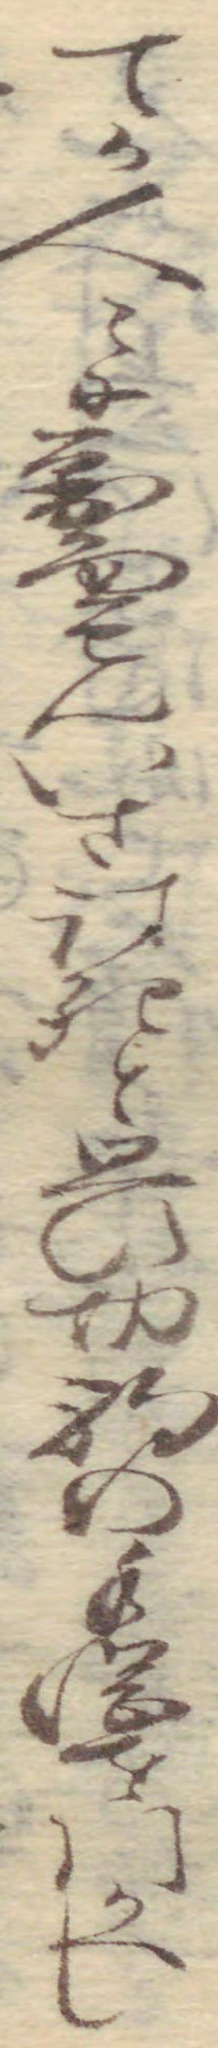てか人々に対面せんいさ討死と思ひ切駒の手綱を引かへし
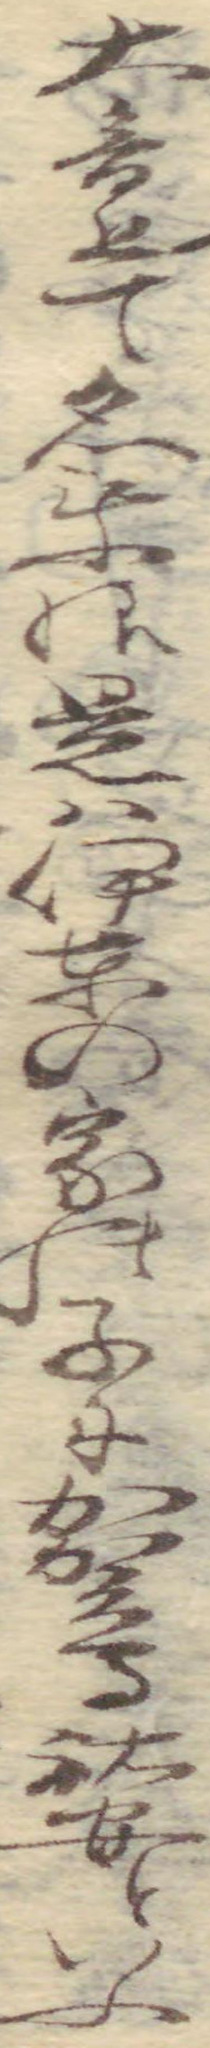大音上て名乗様是は伊東の家の子に加賀守祐安といふ
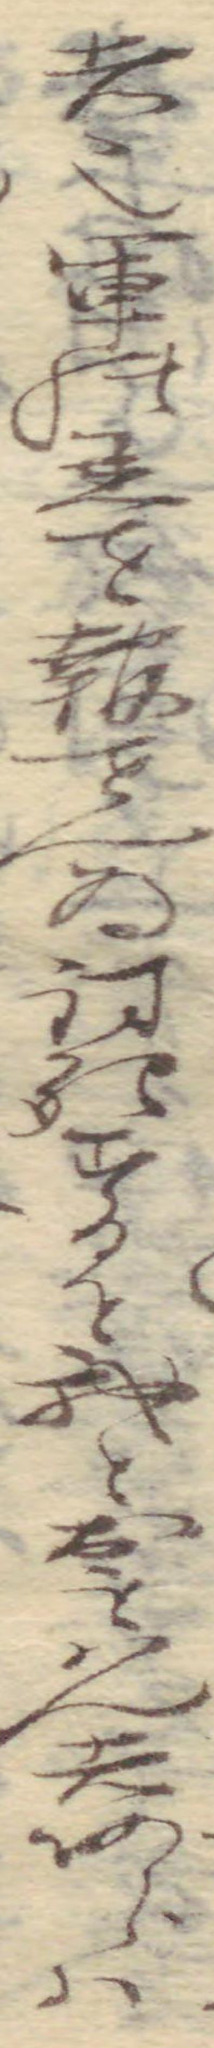者也軍の恩を報せん為討死するそ我とおもはん者あらは
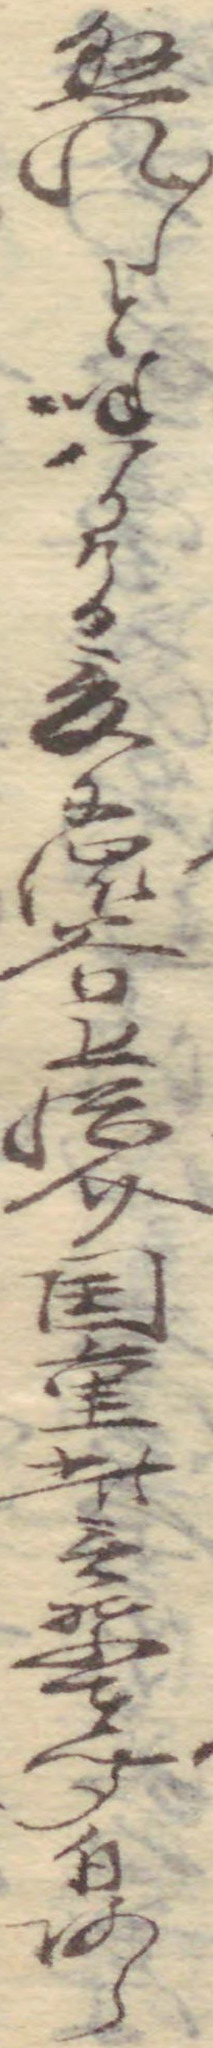懸れ〳〵と呼はりける爰に渋谷上総介国重此言葉を聞付あら
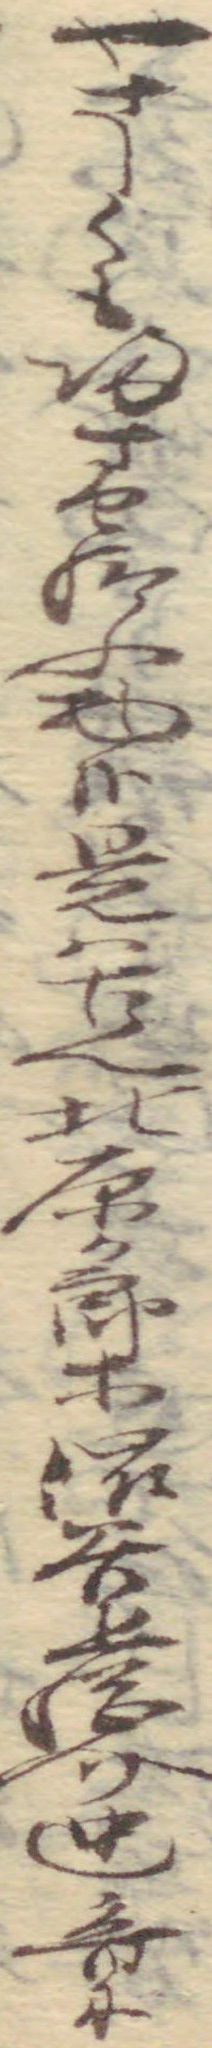やさしくも帰させ給ふ物哉是は克北原か郎等渋谷上総介迚音に
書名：鶯宿雑記. 巻199-200
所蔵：国立国会図書館 National Diet Library, JAPAN
